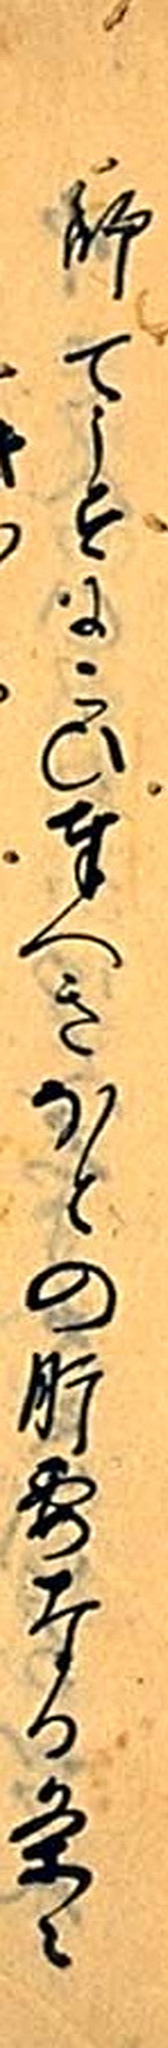師てうすにこひ奉へきほとの肝要なる条々
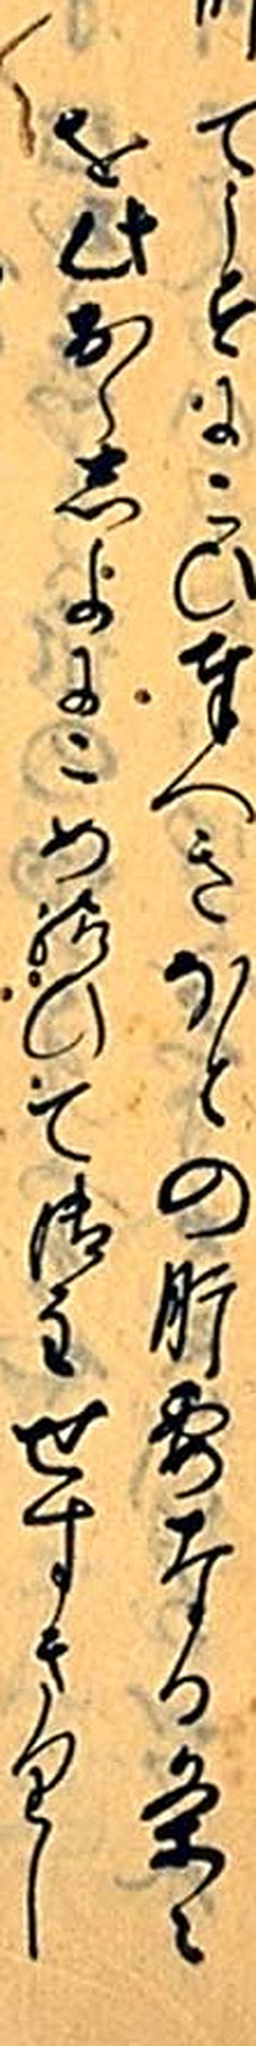を此おらしよにこめ給ひて御主せすきりし
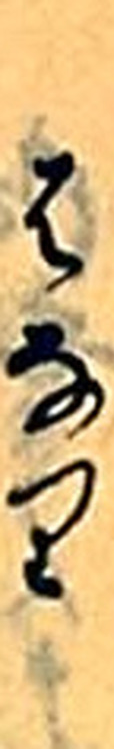はなり
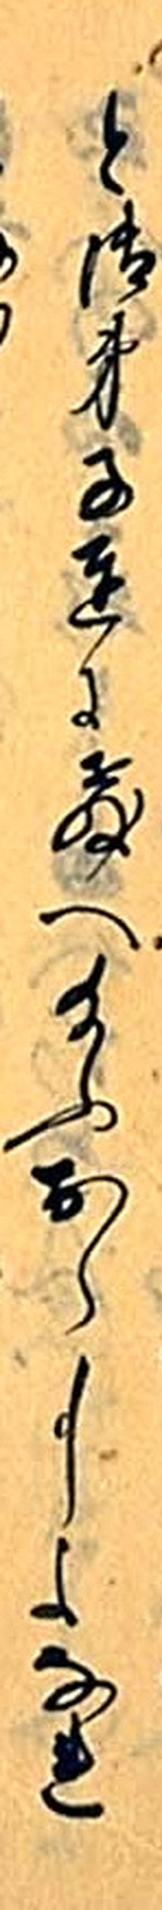と御弟子達に教へ給ふおらしよなれ
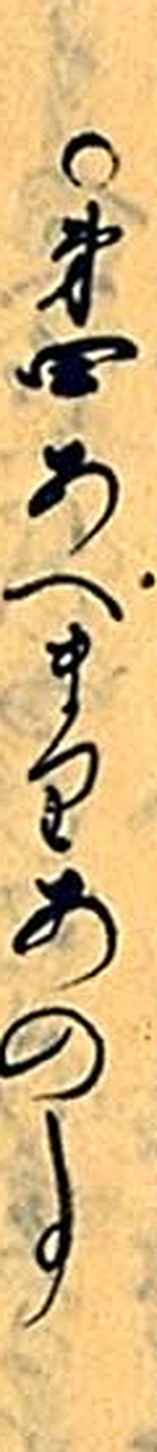○第四あへまりあの事
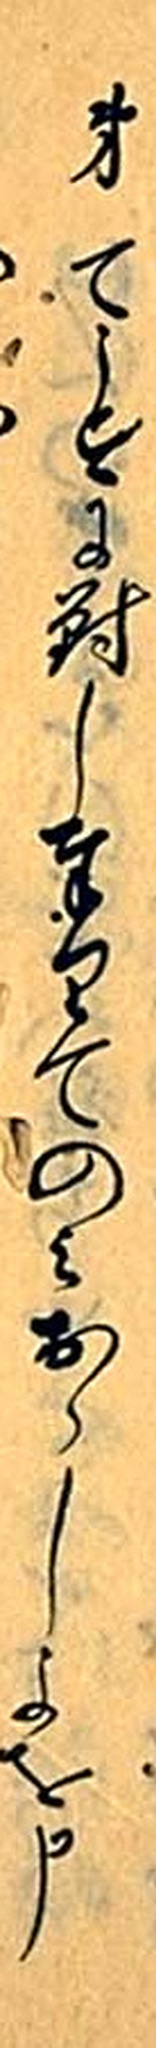弟てうすに対し奉りてのみおらしよを申
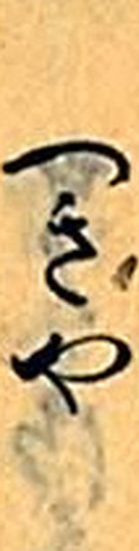へきや
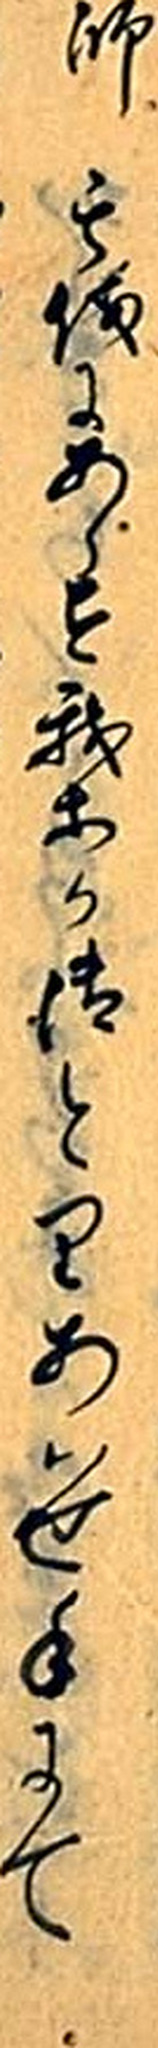師其儀にあらす我等か御とりあはせ手にて
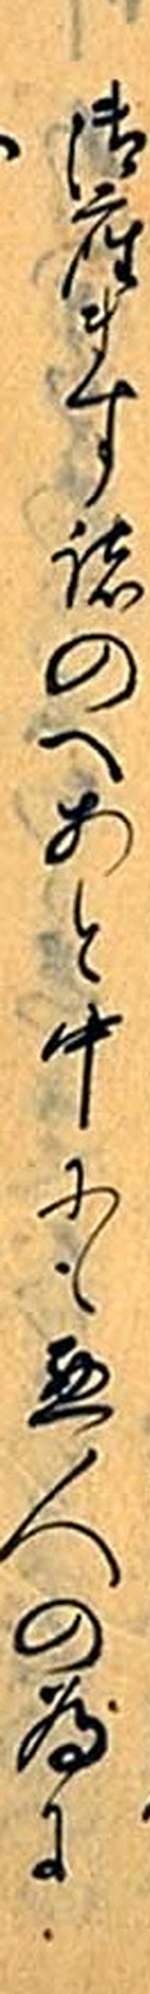御座ます諸のへあと中にも悪人の為に
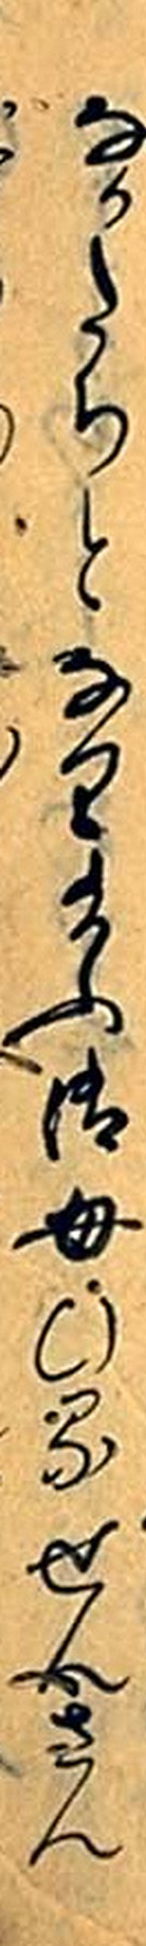なかたちとなり給ふ御母ひるせんさん
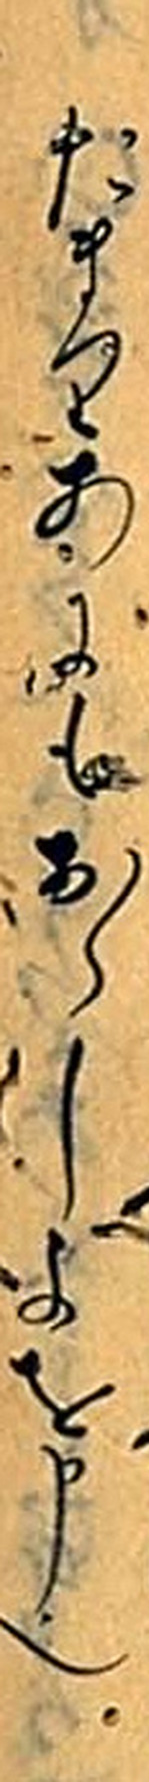たまりあにもおらしよを申也

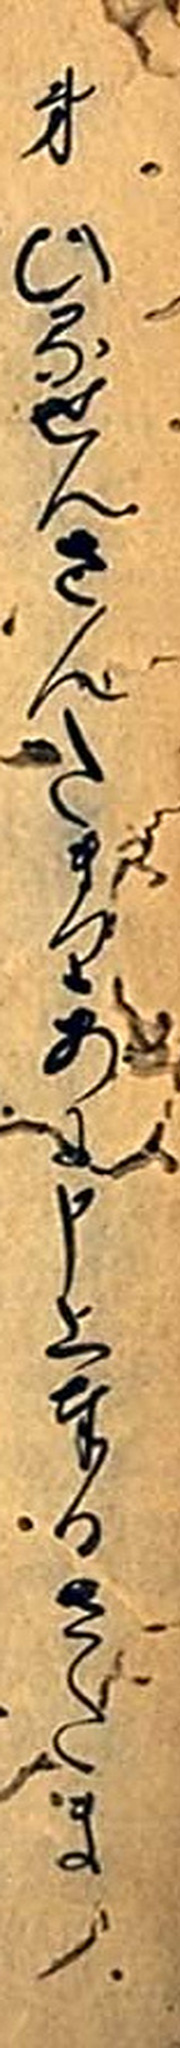弟ひるせんさんたまりあに申上奉るさたま
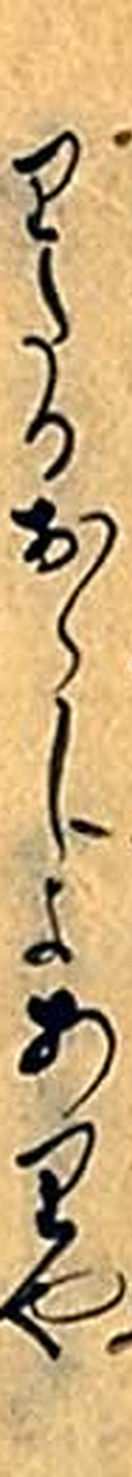りたるおらしよありや
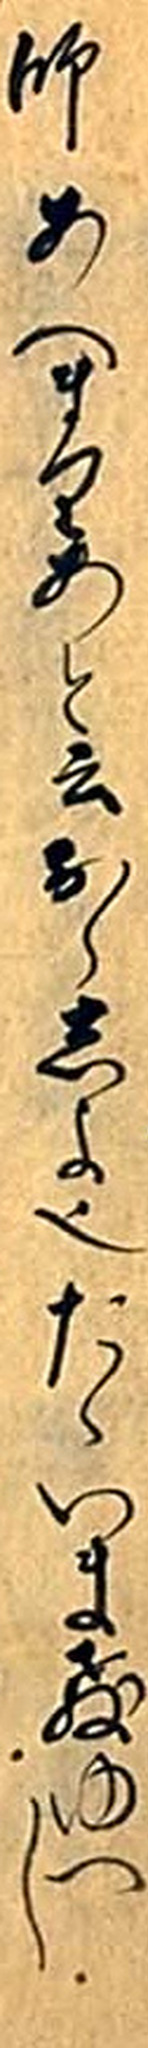師あへまりあと云おらしよ也たゝいま教ゆへし
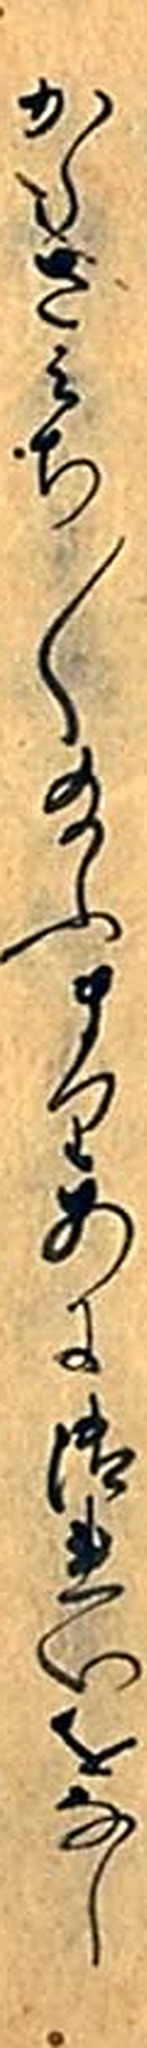からさみち〳〵給ふまりあに御れいをなし
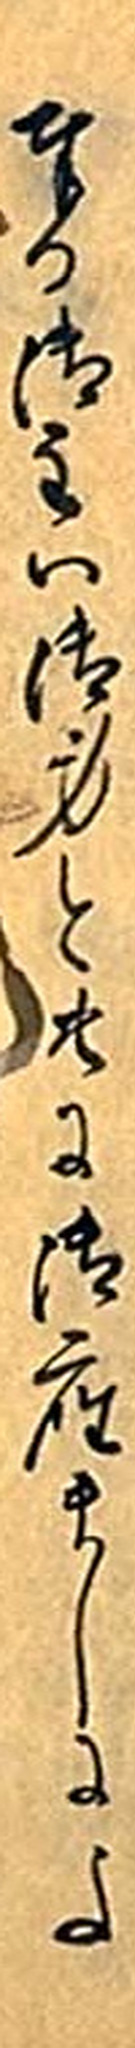奉る御主は御身と共に御座ましによ
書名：ドチリナ・キリシタン
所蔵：東京大学総合図書館 / General Library in the University of Tokyo
